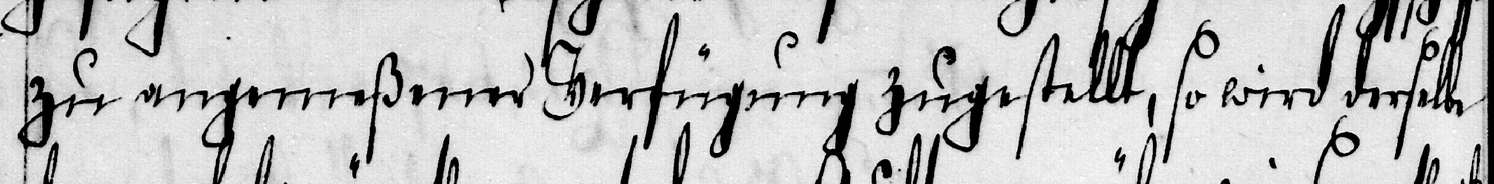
zu angemeßener Verfügung zugestellt, so wird derselbe
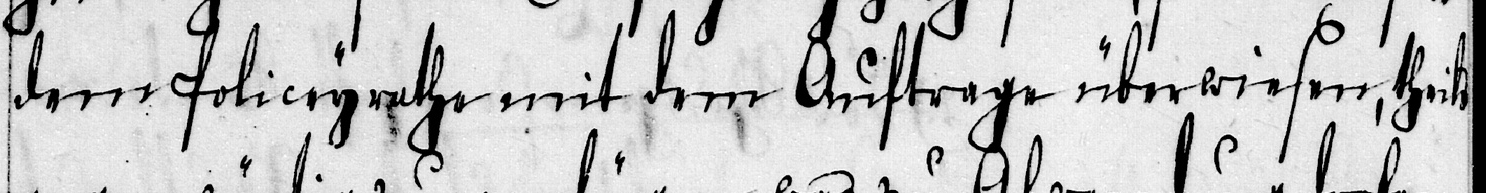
dem Policeyrathe mit dem Auftrage überwiesen, theils
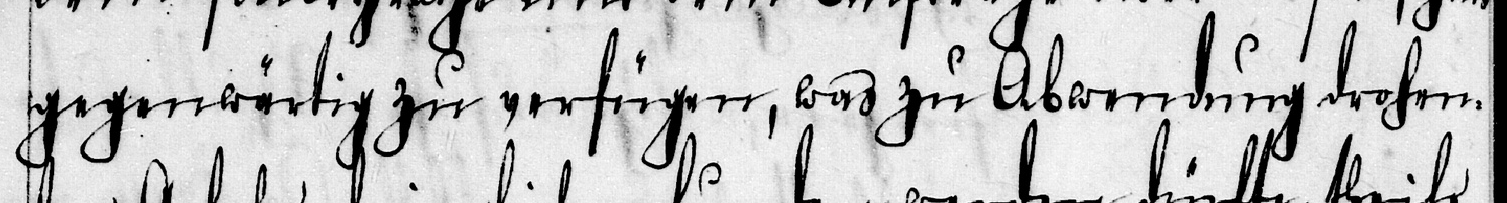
gegenwärtig zu verfügen, was zu Abwendung drohen¬
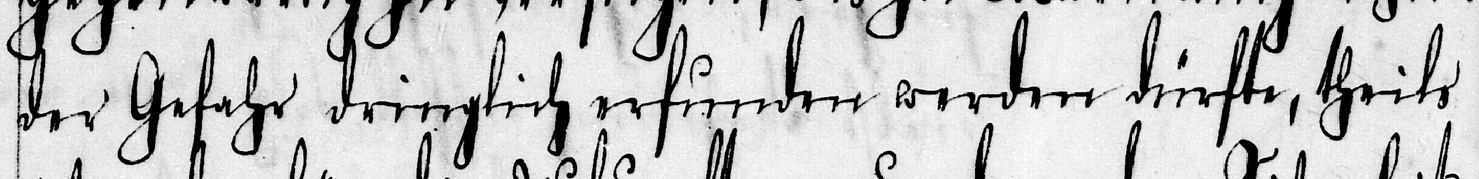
der Gefahr dringlich erfunden werden dürfte, theils
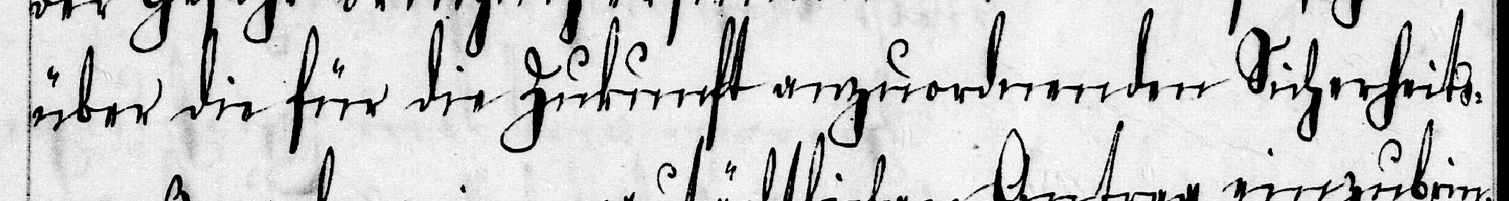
über die für die Zukunft anzuordnenden Sicherheits¬
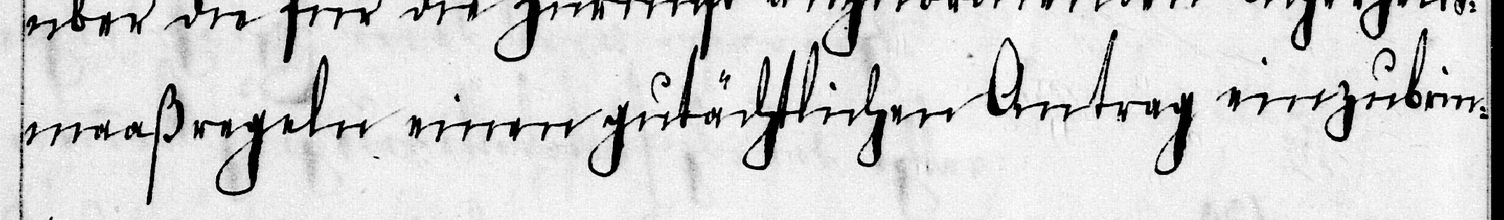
maaßregeln einen gutächtlichen Antrag einzubrin¬
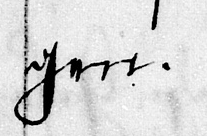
gen.
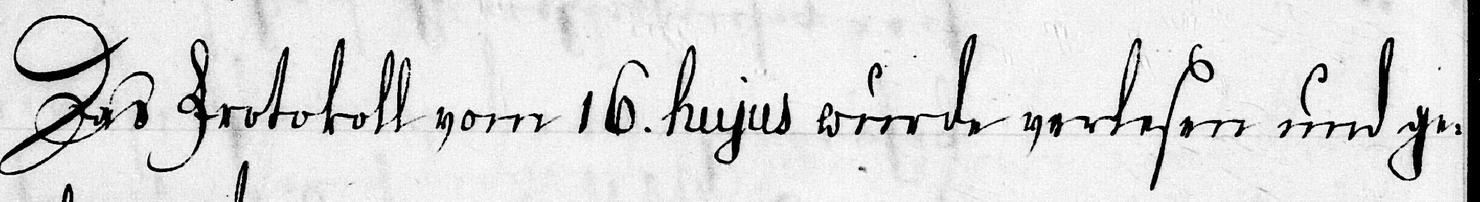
Das Protokoll vom 16. hujus wurde verlesen und ge¬
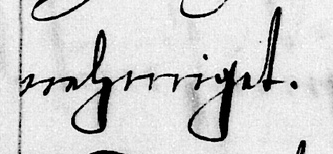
nehmigt.
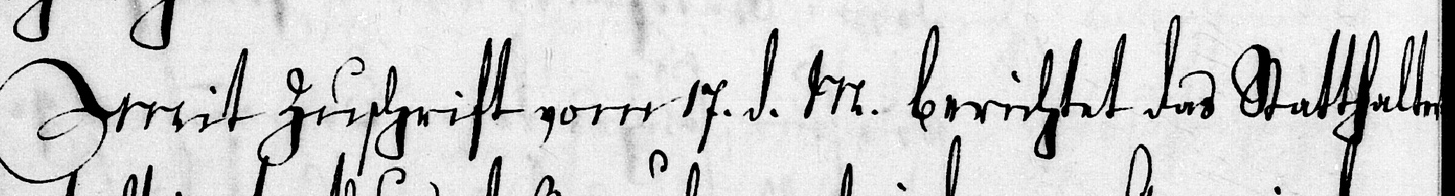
Mit Zuschrift vom 17. d. M. berichtet das Statthalt¬
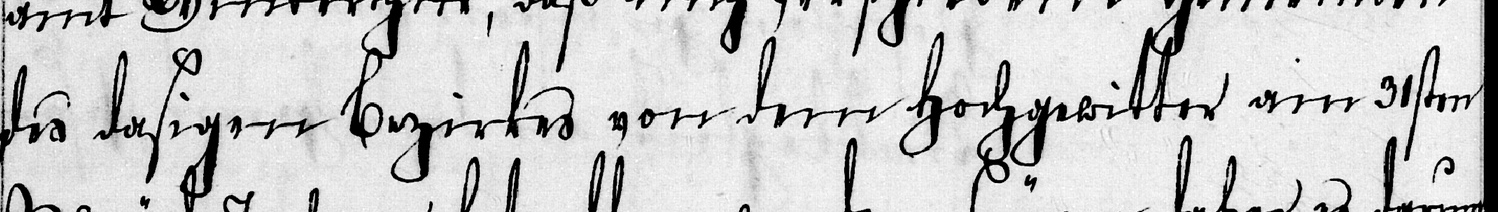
des dasigen Bezirkes von dem Hochgewitter am 31sten
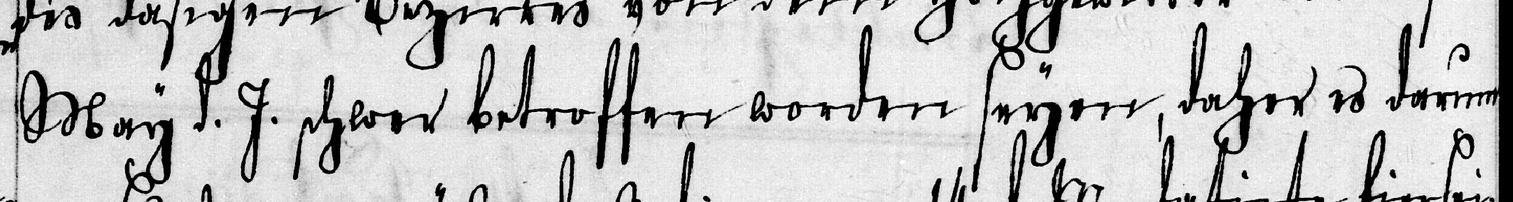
May d. J. schwer betroffen worden seyen, daher es darum
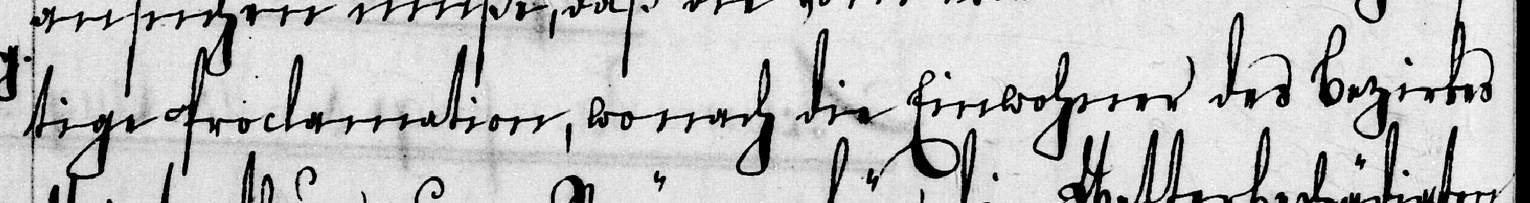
itige Proclamation, wonach die Einwohner des Bezirkes
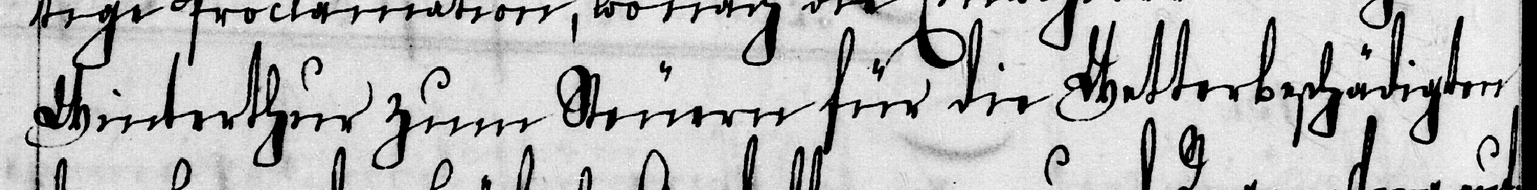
Winterthur zum Steuern für die Wetterbeschädigten
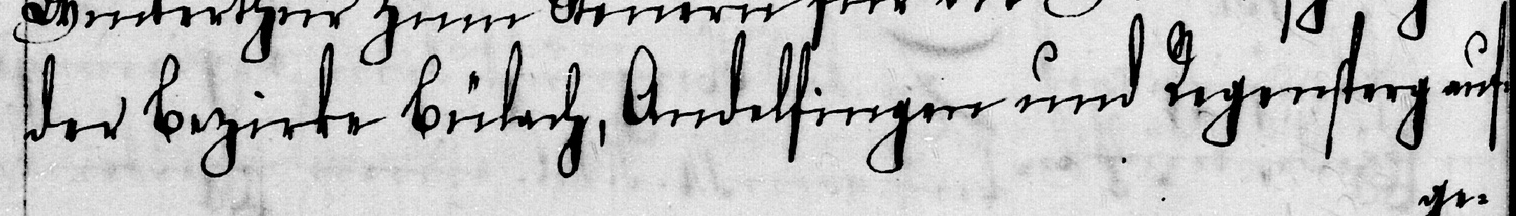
der Bezirke Bülach, Andelfingen und Regensperg au¬
